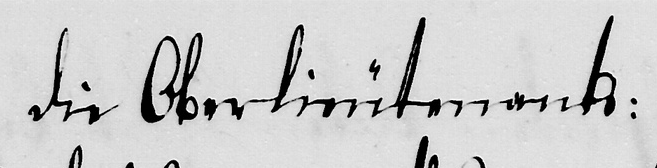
die Oberlieutenants:
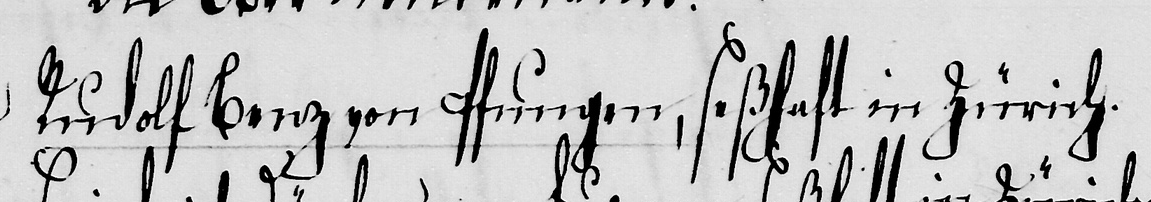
Rudolf Benz von Pfungen, seßhaft in Zürich.
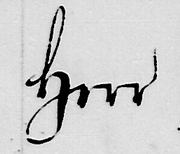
Herr
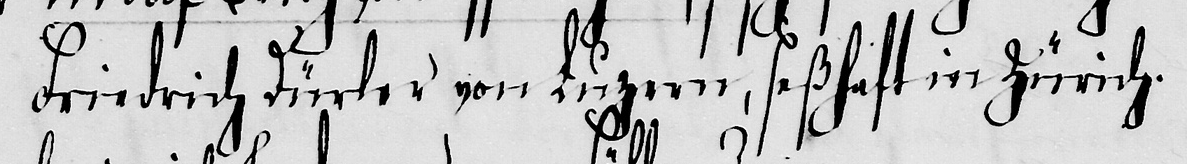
Friedrich Dürler von Luzern, seßhaft in Zürich.
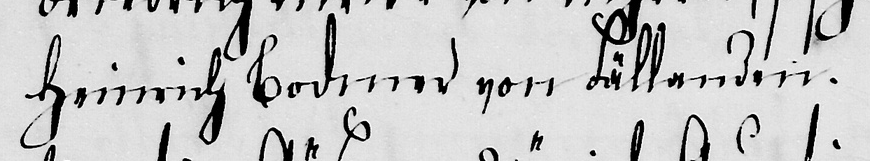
Heinrich Bodmer von Fällanden.
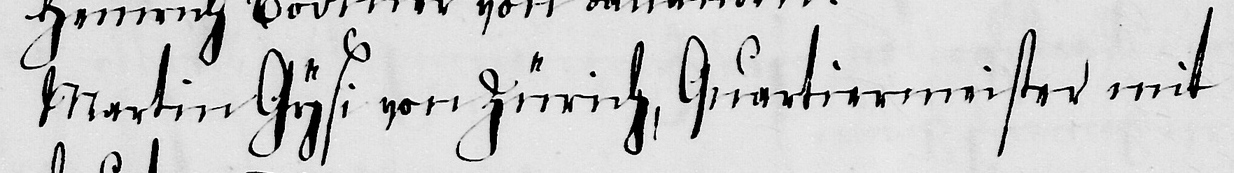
Martin Gysi von Zürich, Quartiermeister mit
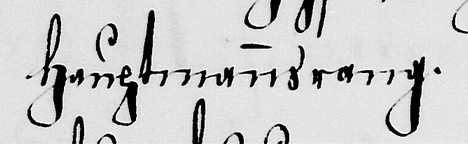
Hauptmannsrang.
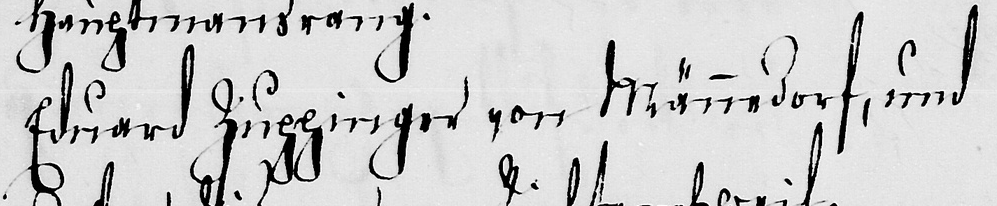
Eduard Zuppinger von Männedorf, und
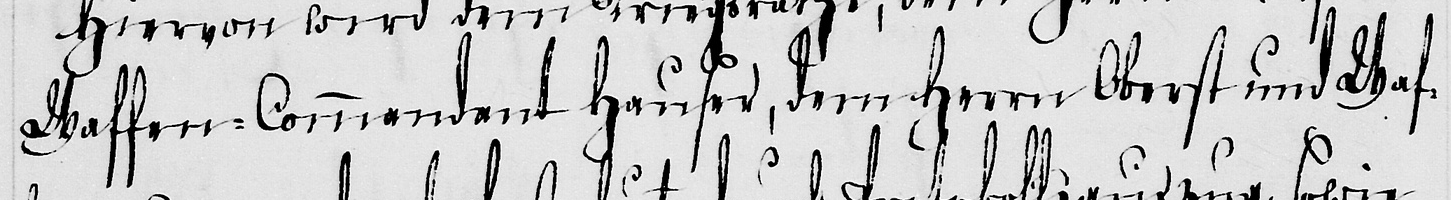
Waffen-Commandant Hauser, dem Herrn Oberst und Waf¬
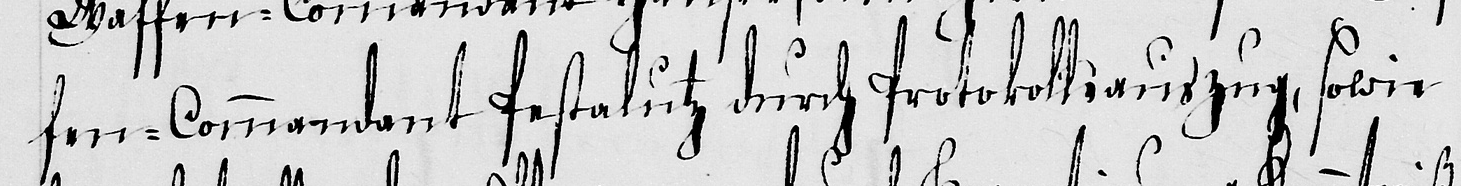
fen-Commandant Pestalutz durch Protokollsauszug, sowie
